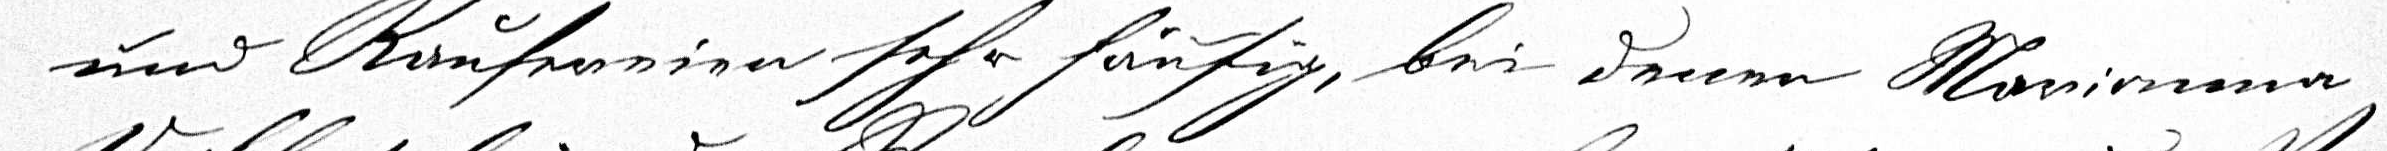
und Raufereien sehr häusig, bei denen Marianna
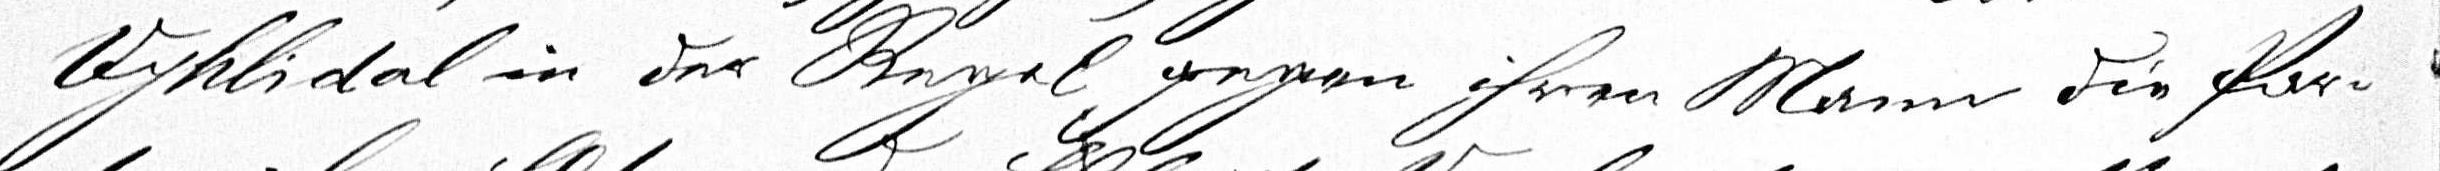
Vyhlidal in der Regel gegen ihren Mann die Par¬
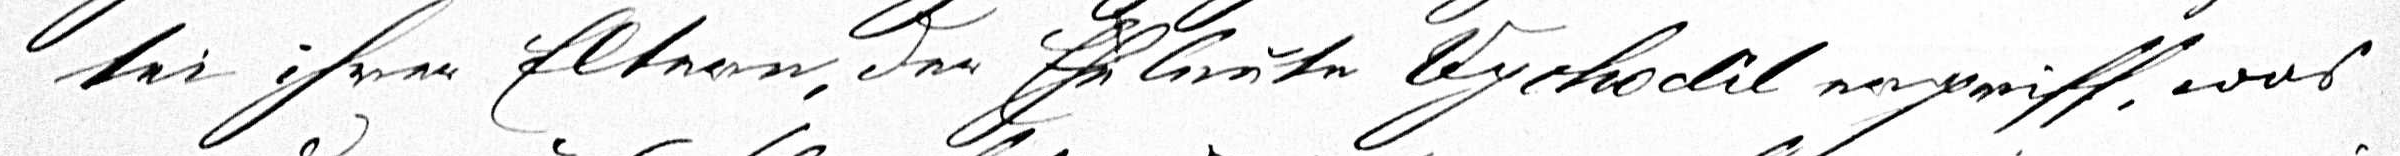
tei ihrer Eltern, der Eheleute Vychodil ergriff, was
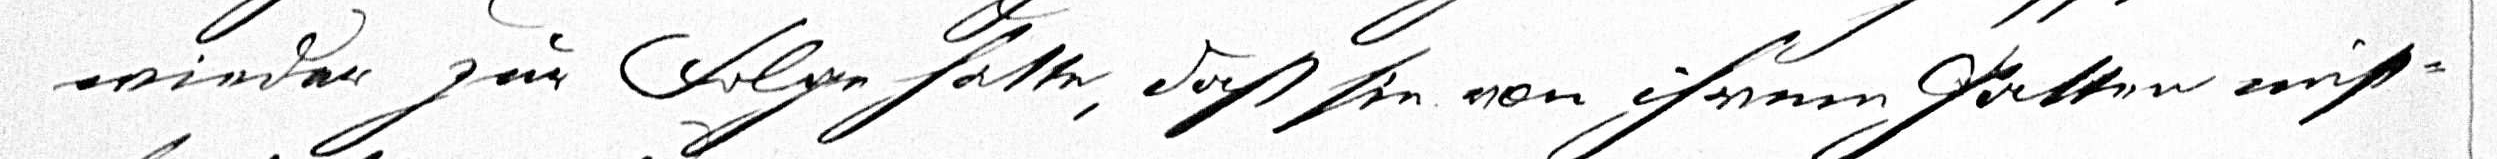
wieder zur Folge hatte, daß sie von ihrem Gatten miß¬
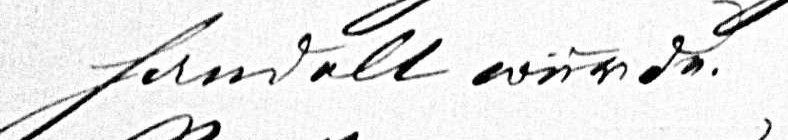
handelt wurde.
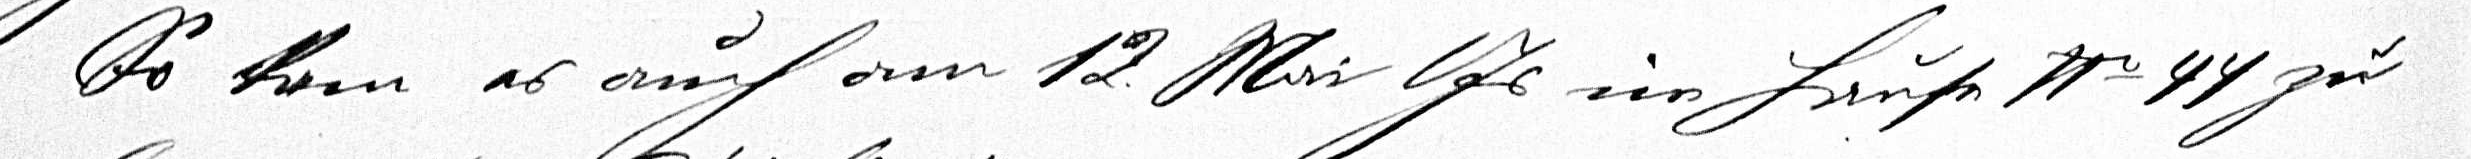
So kam es auch am 12. Mai lJs im Hause tto 44 zu
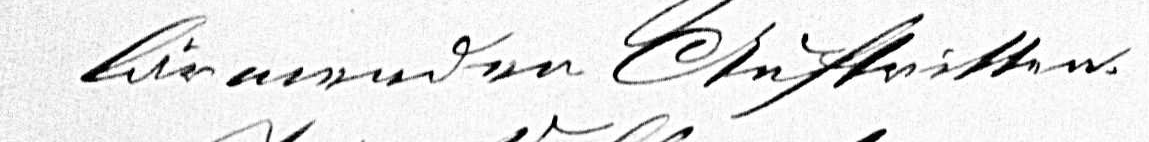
lärmenden Auftritten.
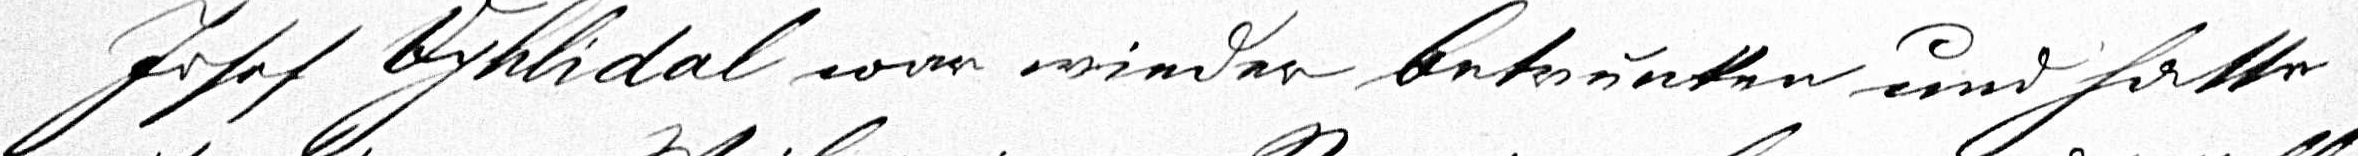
Josef Vyhlidal war wieder betrunken und hatte
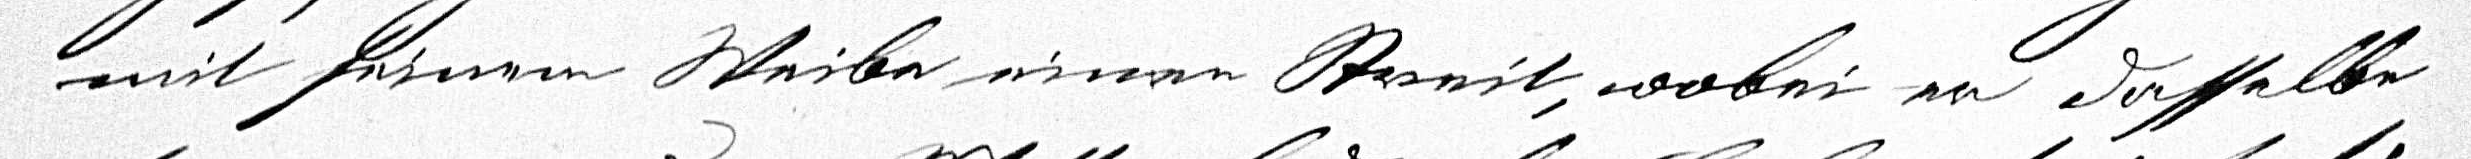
mit seinem Weibe einen Streit, wobei er dasselbe
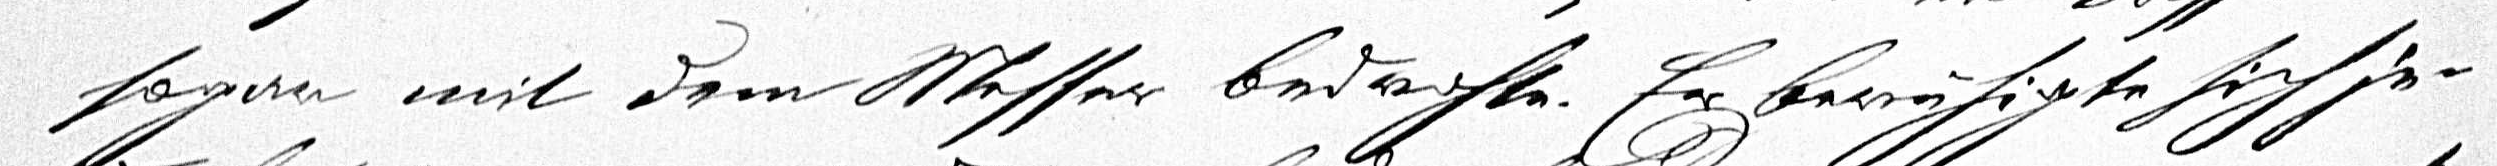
sogar mit dem Messer bedrohte. Er beruhigte sich je¬
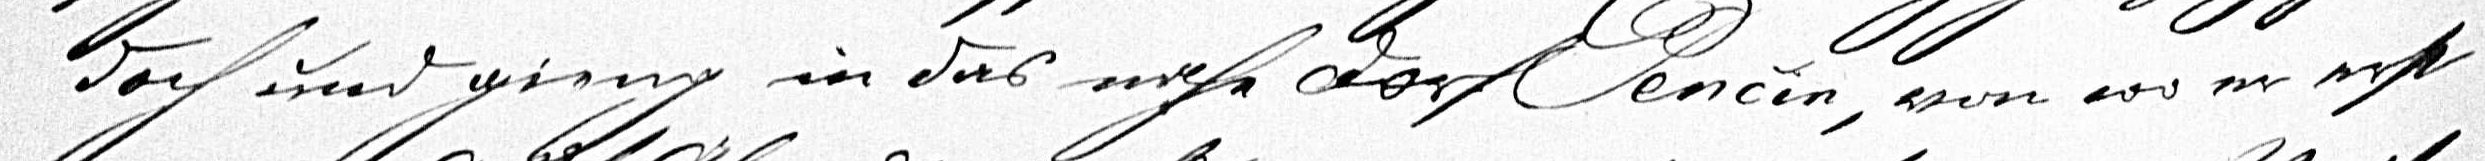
doch und gieng in das nahe Dorf Penčin, von wo er erst
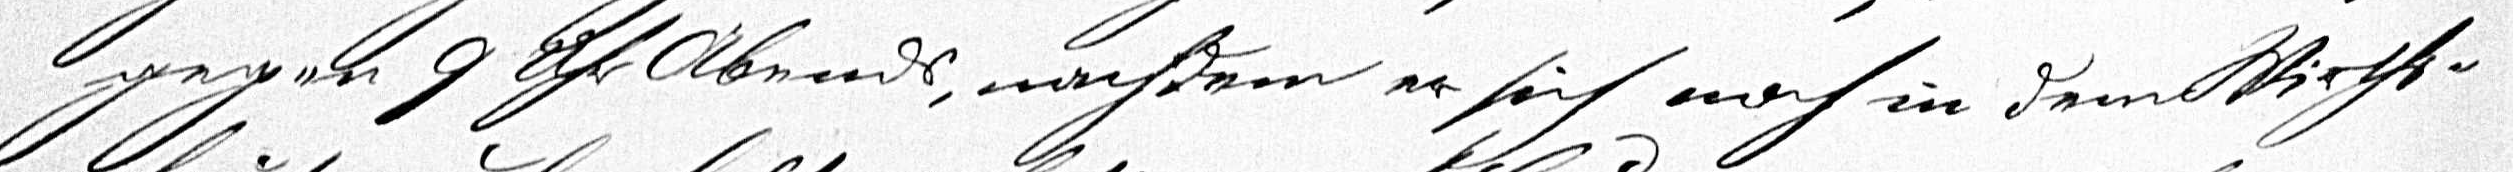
gegen 9 Uhr Abends, nachdem er sich noch in dem Wirths¬
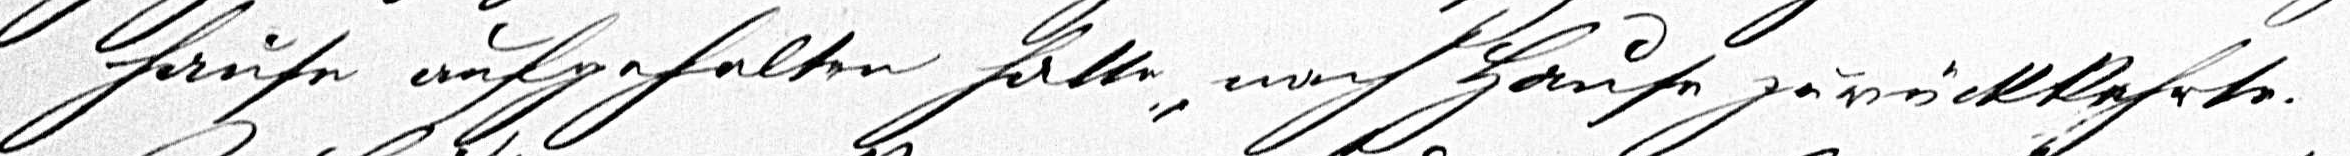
hause aufgehalten hatte, nach Hause zurückkehrte.
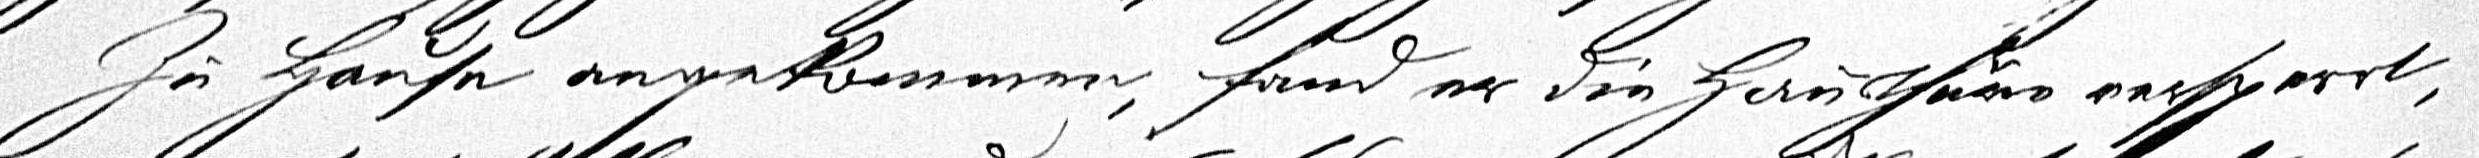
Zu Hause angekommen, fand er die Hausxx versperrt,
